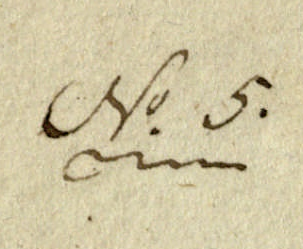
No 5.
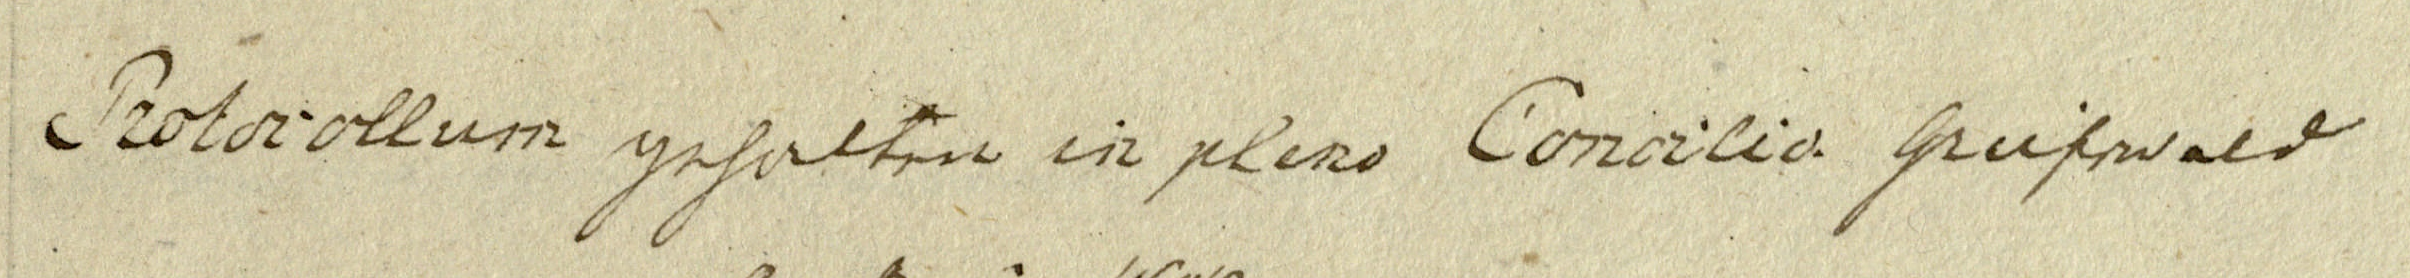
Protocollum gehalten in pleno Concilio Greifswald
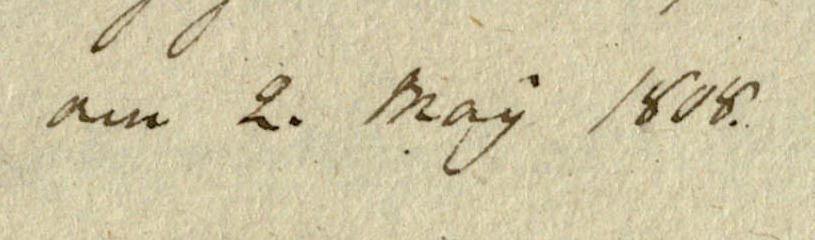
am 2. Maÿ 1808.
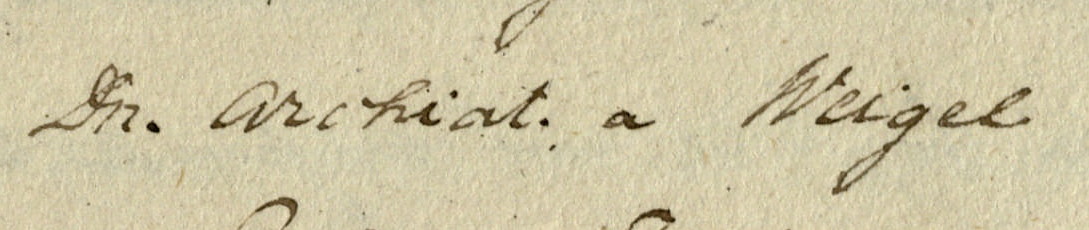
Dn. Archiat. a Weigel.
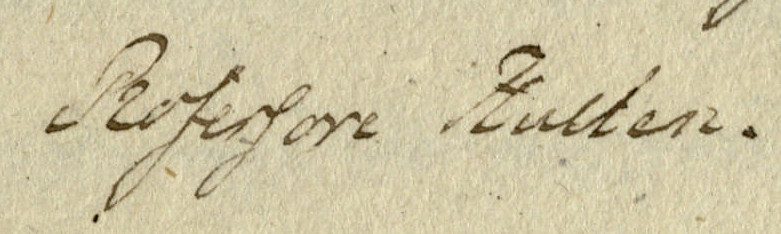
Professore Hulten.
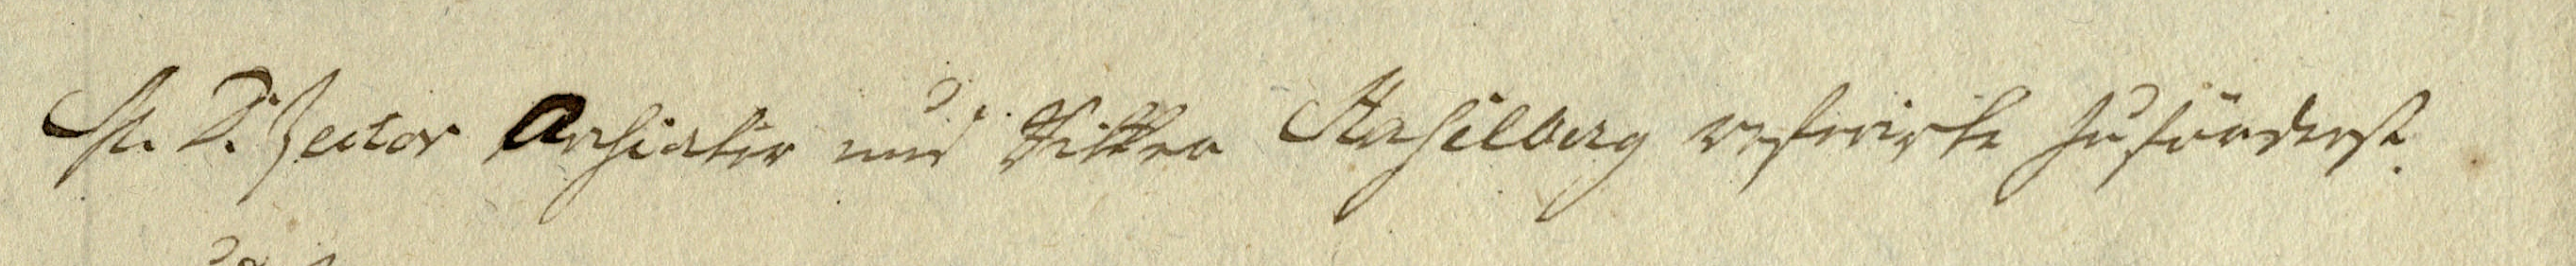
M. D. Rector Archiater und Ritter Haselberg referirte zuförderst
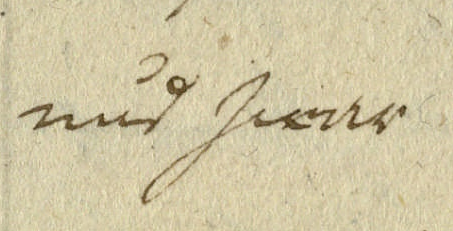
und zwar
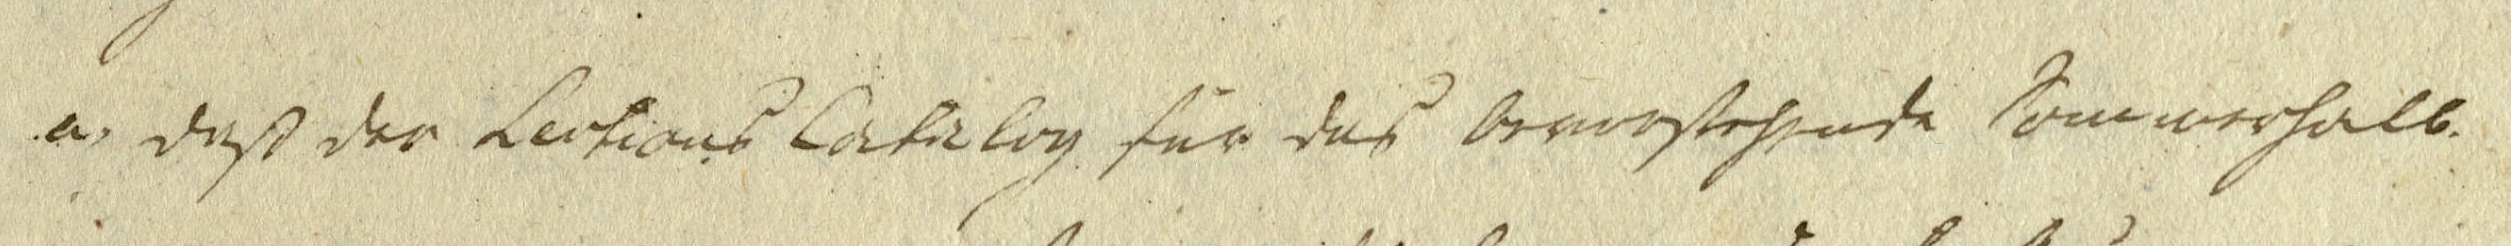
a. daß der Lections Catalog für das bevorstehende Sommerhalb
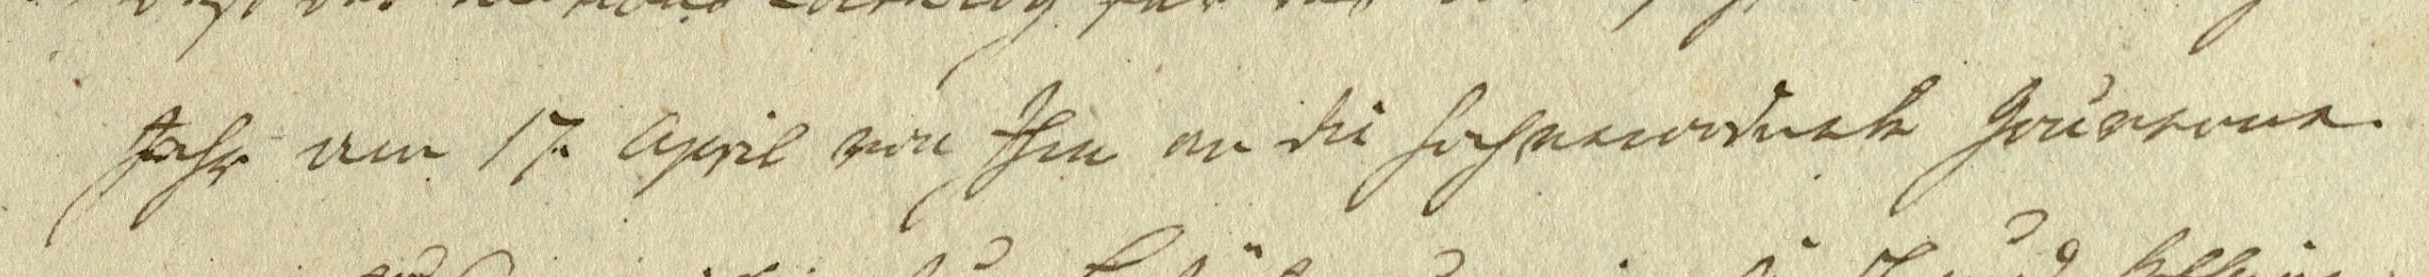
Jahr am 17. April von ihm an die hochverordnete Gouverne¬
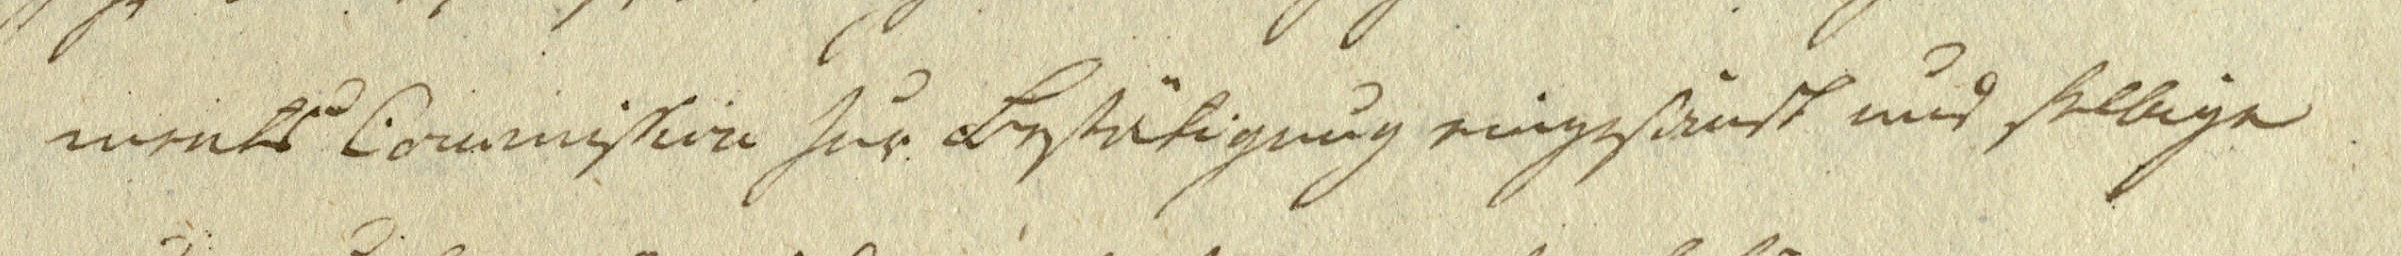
ments Commission zur Bestätigung eingesandt und selbige
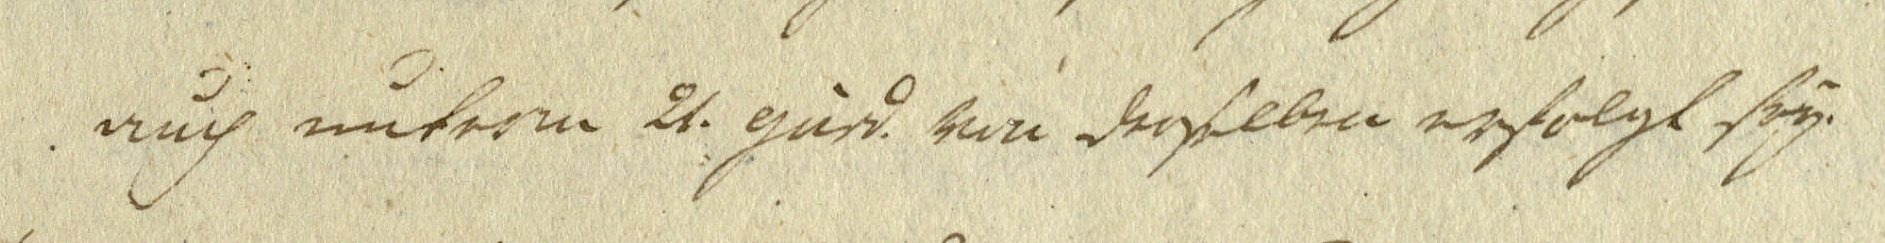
auch unterm 21. ejusd. von derselben erfolgt seÿ.
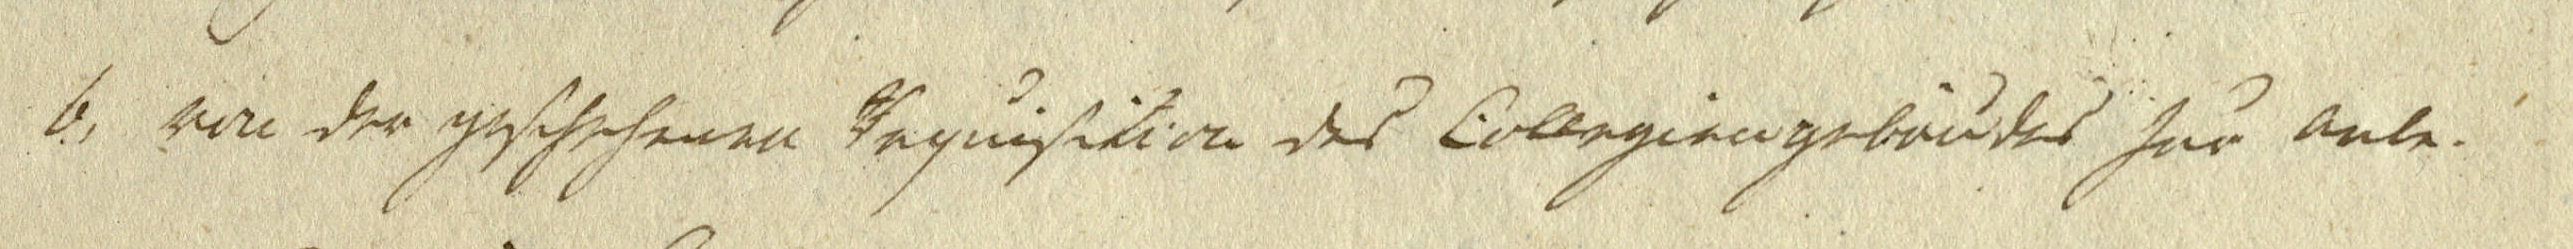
b., von der geschehenen Requisition des Collegiengebäudes zur Anle¬
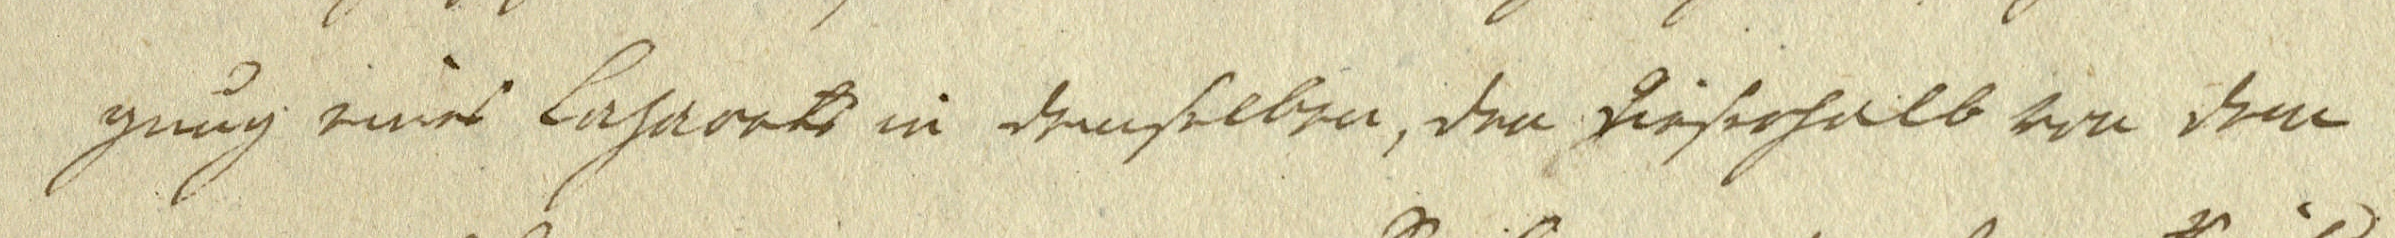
gung eines Lazarets in demselben, der dieserhalb von dem
